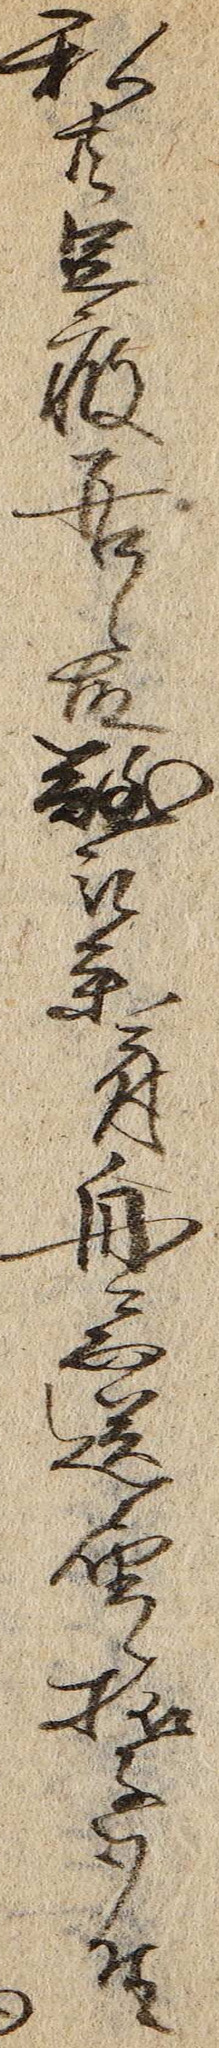私ども足疲居候故難被参に付舟にて送届候様に御座候
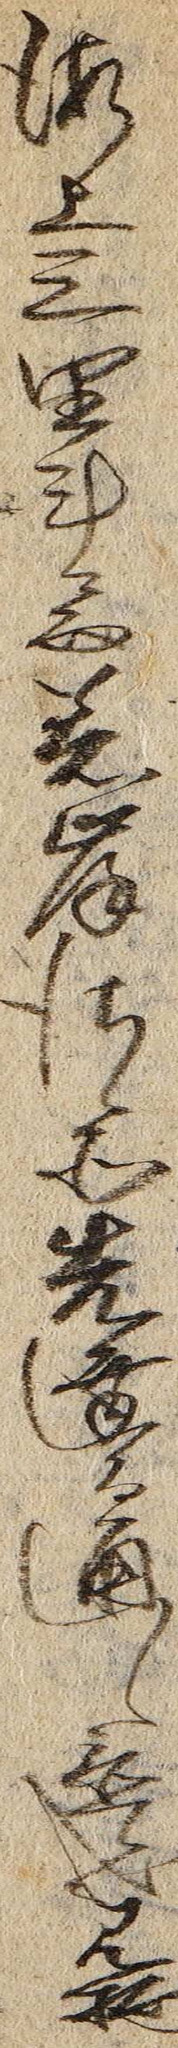海上三里斗にて着岸仕候所先達て通し置候哉見物
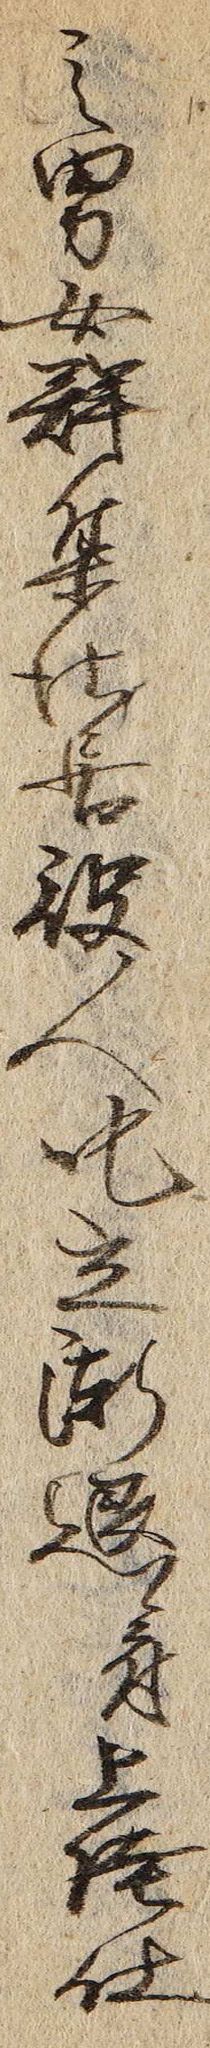の男女群集仕居役人叱立漸退候に付上陸仕
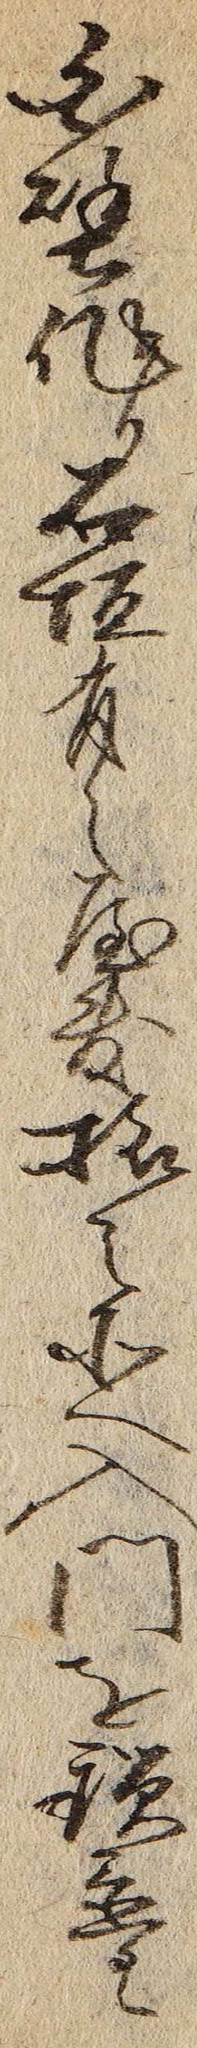白壁作り石垣有之屋敷様の所へ入門を鎖置申候
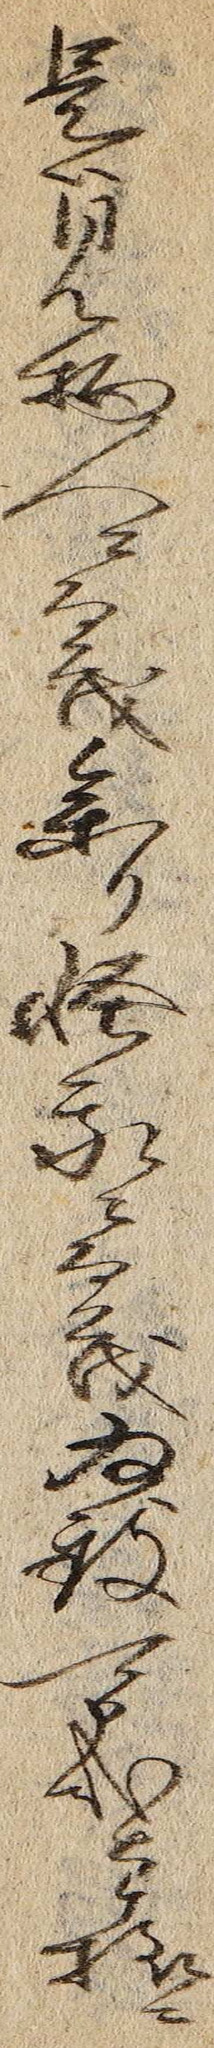是は見物人にても参り怪我にても為致可申哉とケ様に
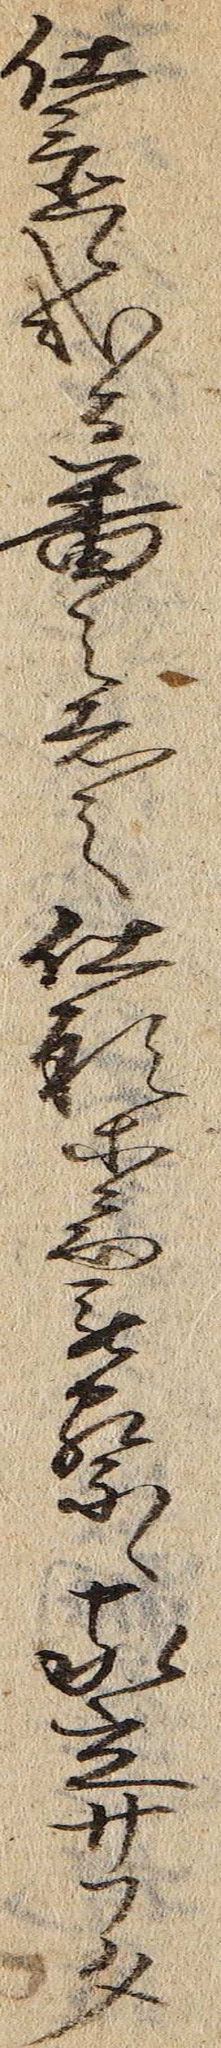仕置候哉と番の者の仕形等にて被察候家立サフタ
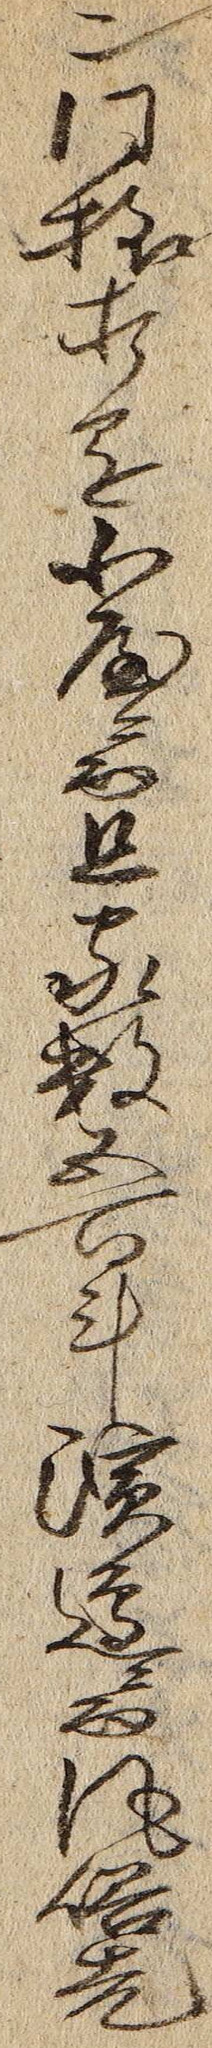ン同様打懸小屋にて且家数五百斗浜辺にて風俗先
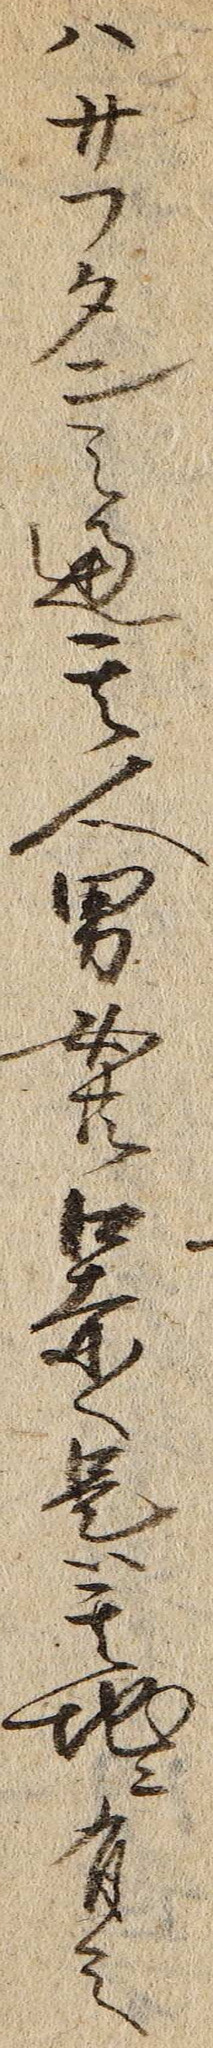はサフタンの通其人男女とも口赤く是は其地に有之
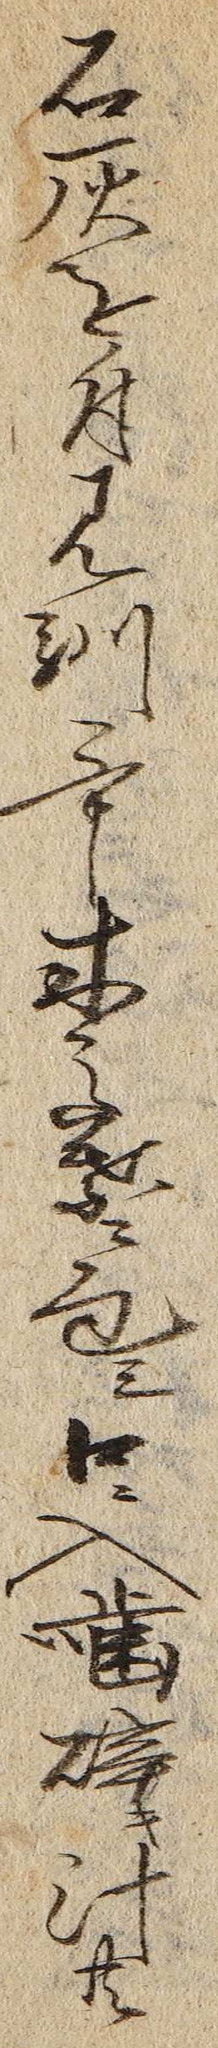石灰を付見馴不申木の葉に包み口に入噛砕き汁とも
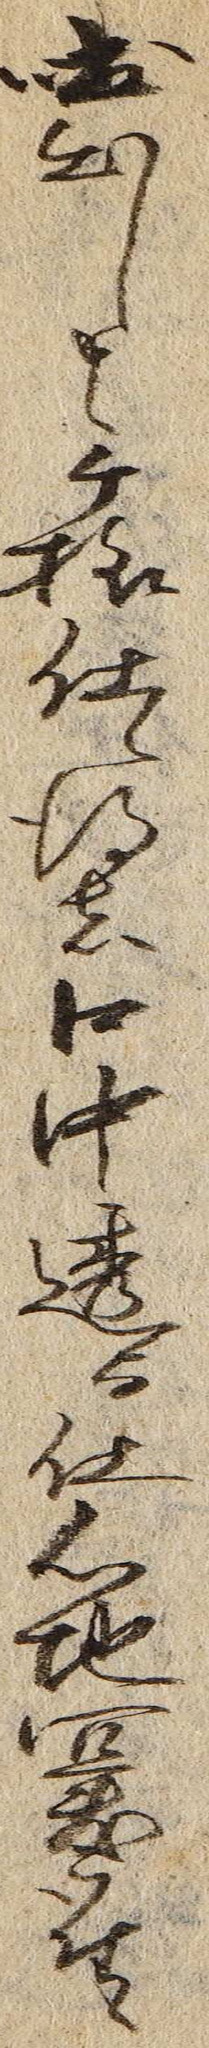吐出し申候ケ様仕候得ば口中透と仕心地宜しく御座候
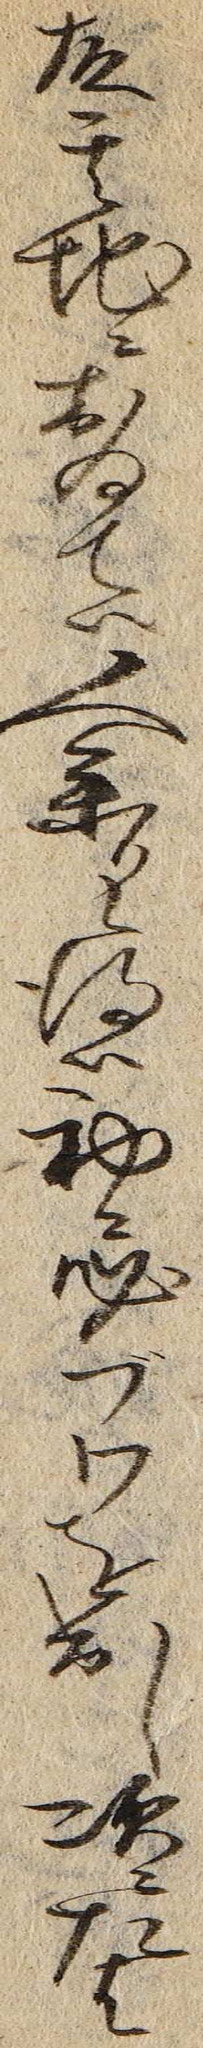故其地におゐては人参り候えは初に必ブワを出し次にたは
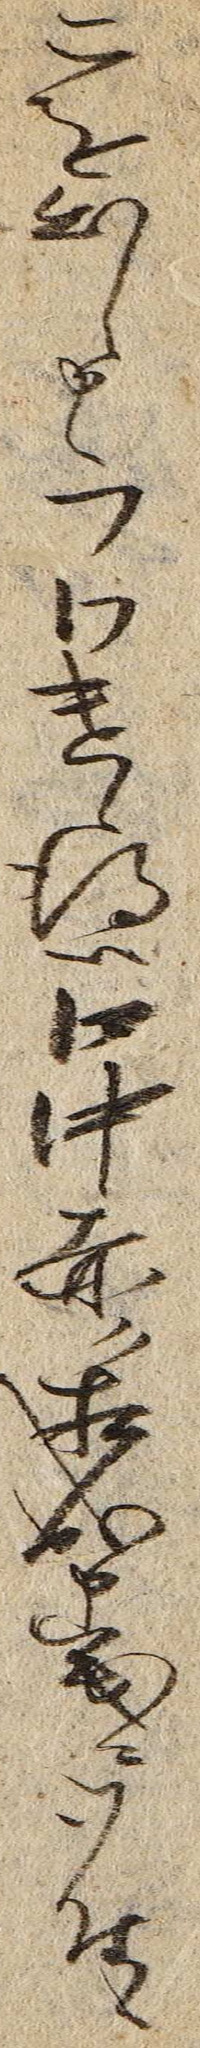こを出し申候フワ遣候得ば口中赤く相成申義に御座候
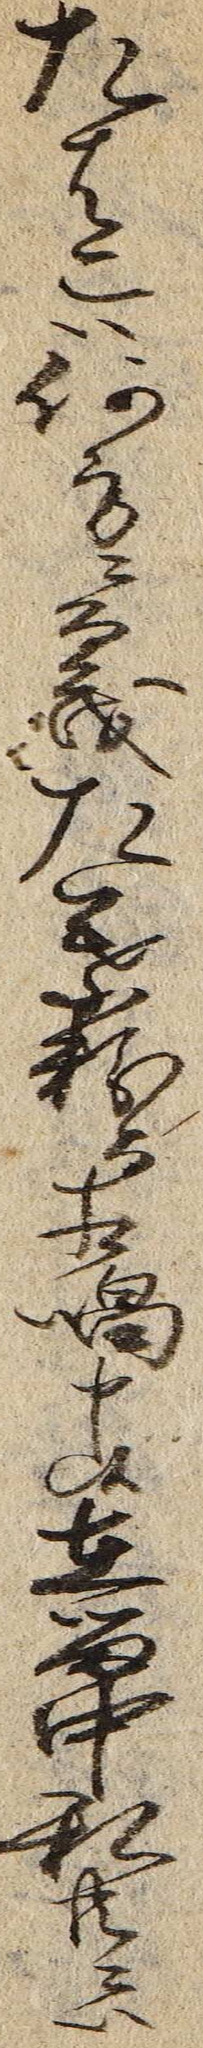たはこは何方にてもた葉粉と相唱申候在留中私どもには
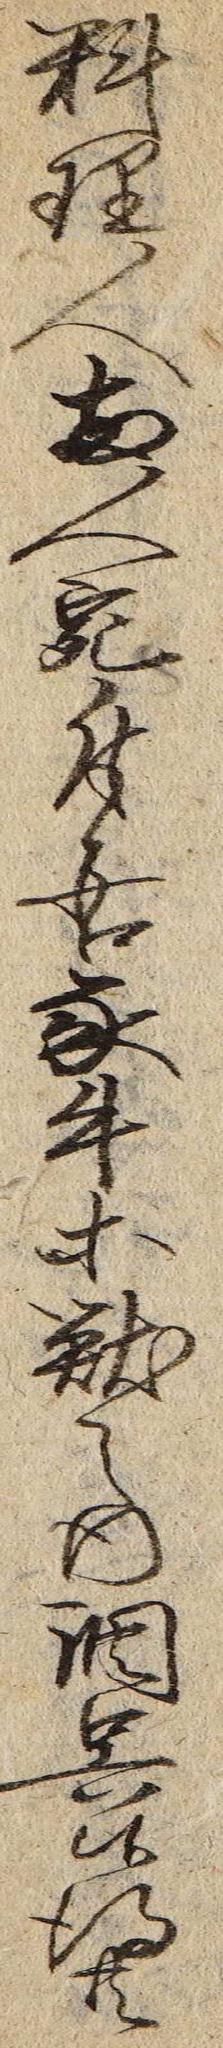料理人両人ずつ付居豕牛等獣の肉調呉候得ども
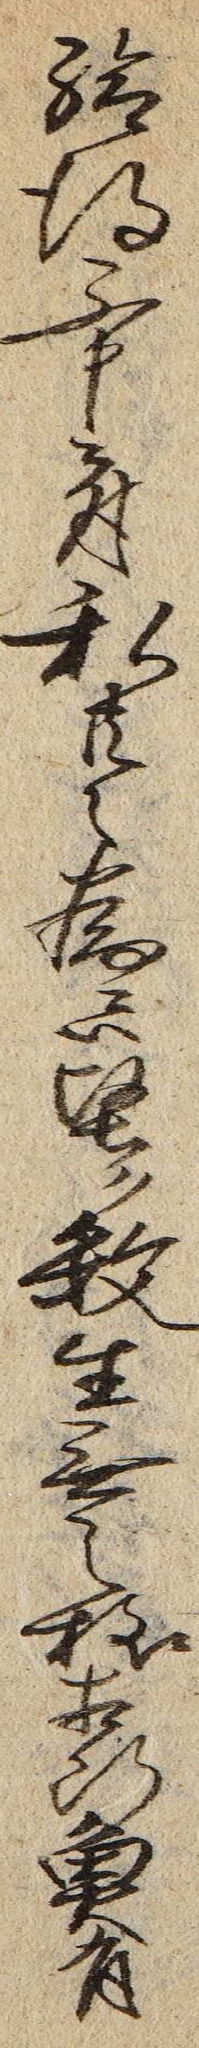給得不申に付私どもの為には堅く殺生無之様相断魚有
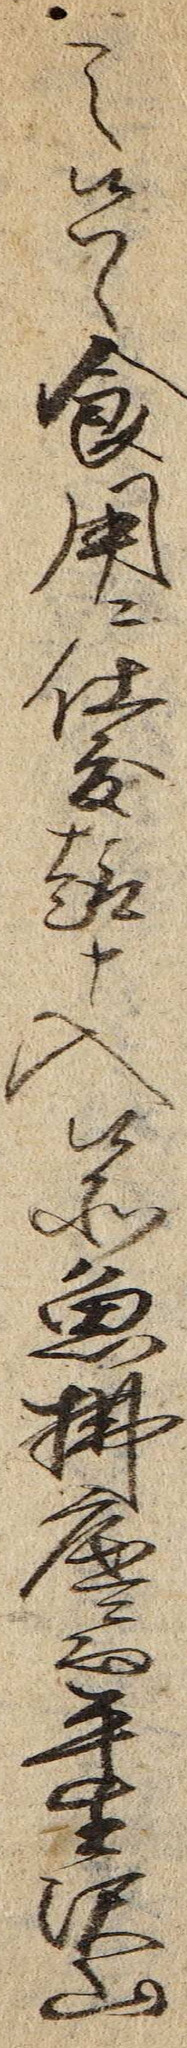之候はば食用に仕度趣申入候所魚払底にて平生沢山
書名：能登国清兵衛異国江漂流之始末
